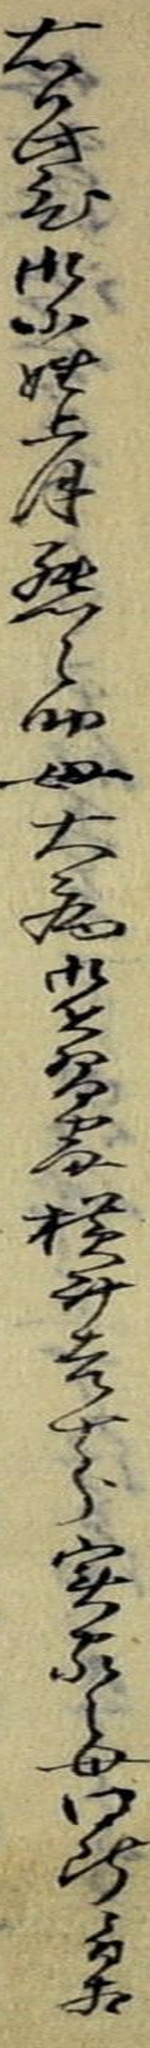右は此度御小姓上月熊之助母大病御近習番横井吉十郎実家母同断に付相
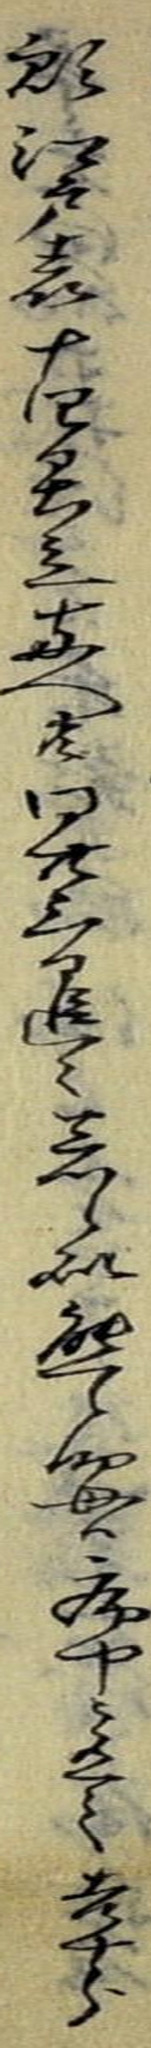願江戸表十四日出立両人共同廿三日追々着候処熊之助母は病中に有之吉十郎
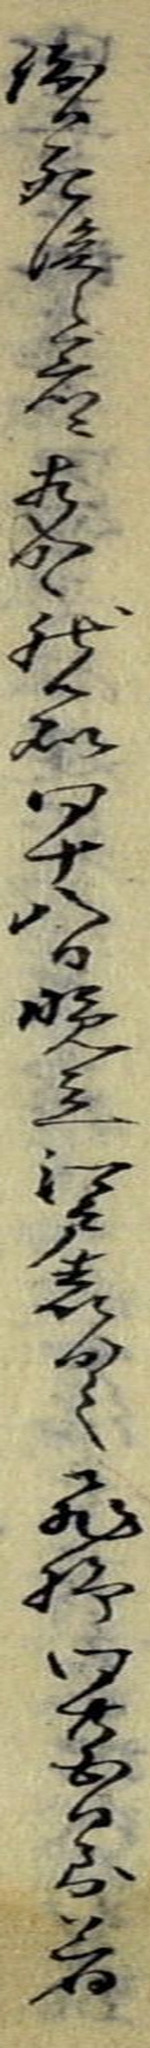儀は死後之着に相成候然ル処同十八日晩立江戸表ゟ之飛脚同廿五日到着
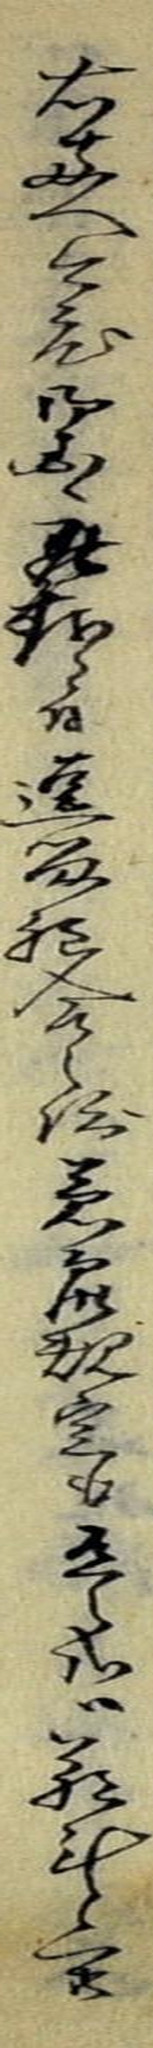右両人今度御国へ罷越候に付逗留程合之儀兼而御規定も有之哉は難計候へ共
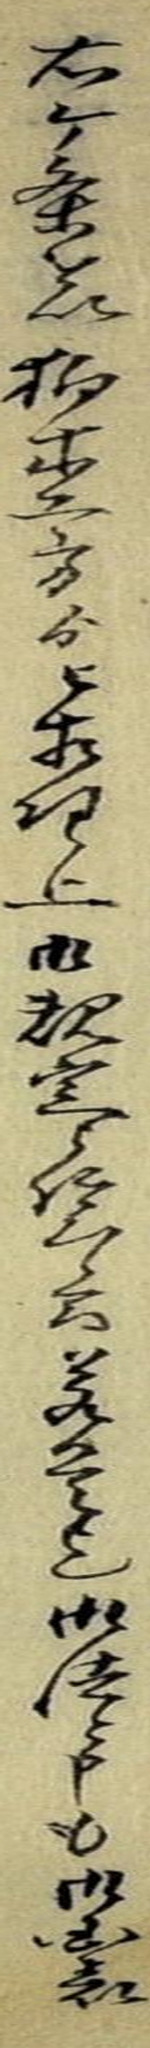右ヶ条を以狛木工方ゟ被相伺候上御規定被仰出候間若是迄御法と申も御国表
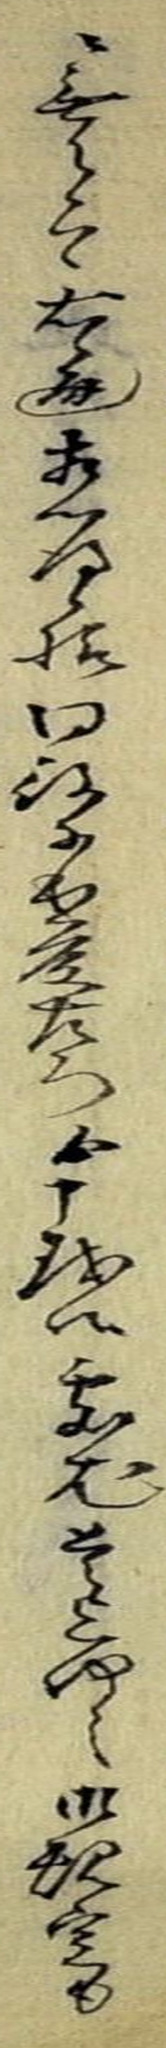に無之候はヽ右之通相心得候様同役千野藤左衛門ゟ申越候処尤是迄何之御規定も
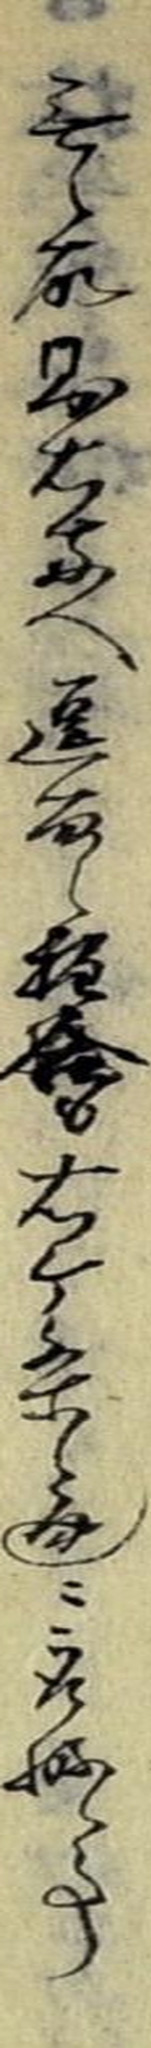無之故即右両人逗留之振合も右ヶ条之通に取扱候事
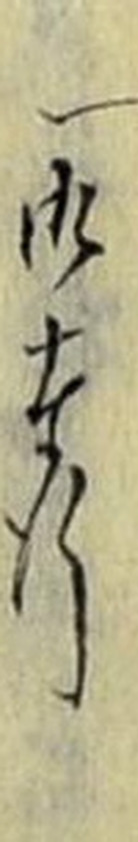御奉行
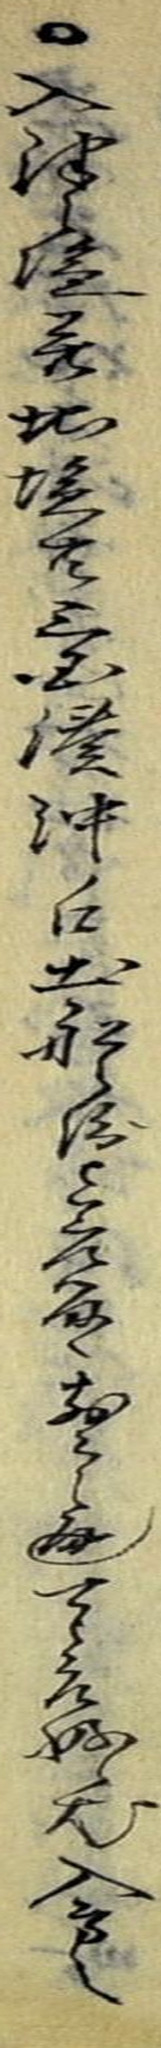○入津之塩并地塩共三国湊沖ノ口出船之儀被差留候前々之通可被取扱候尤入方之
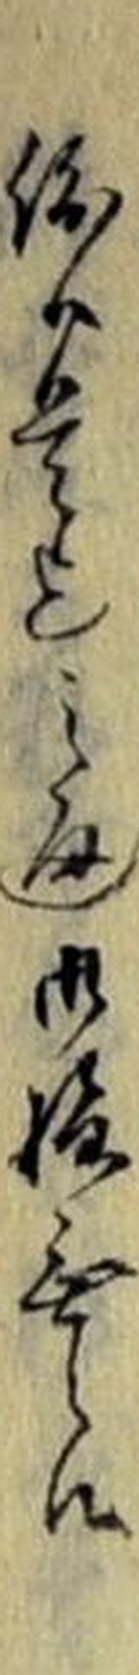儀は是迄之通御構無之候
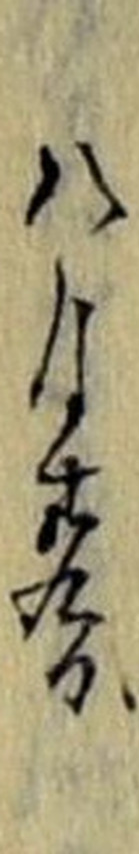八月廿九日

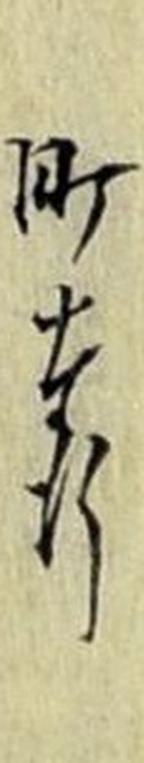町奉行
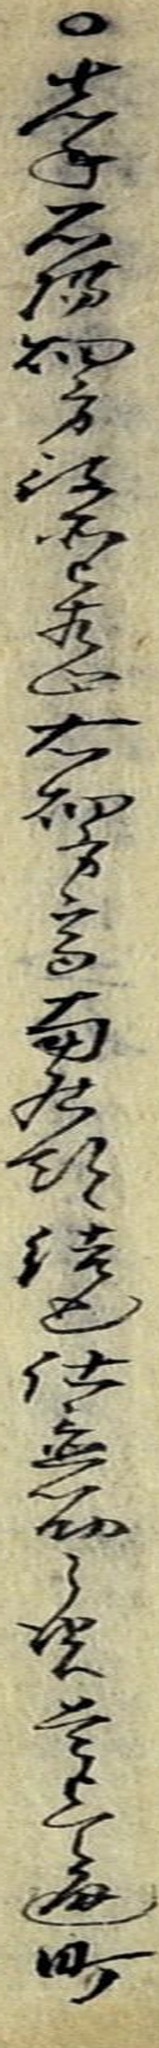○先年石場畑方役所被相止右畑方高南居領へ詰込仕置筋之儀は是迄之通町
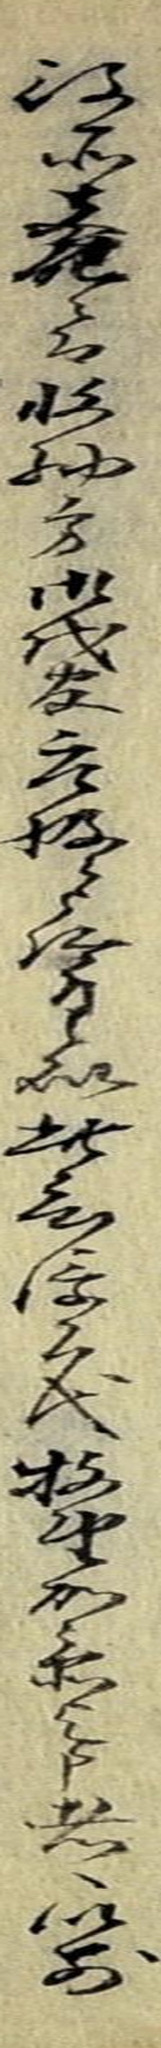役所支配に而収納方御代官被取扱に被仰付候処此度添下代牧野加兵衛と申者へ以前
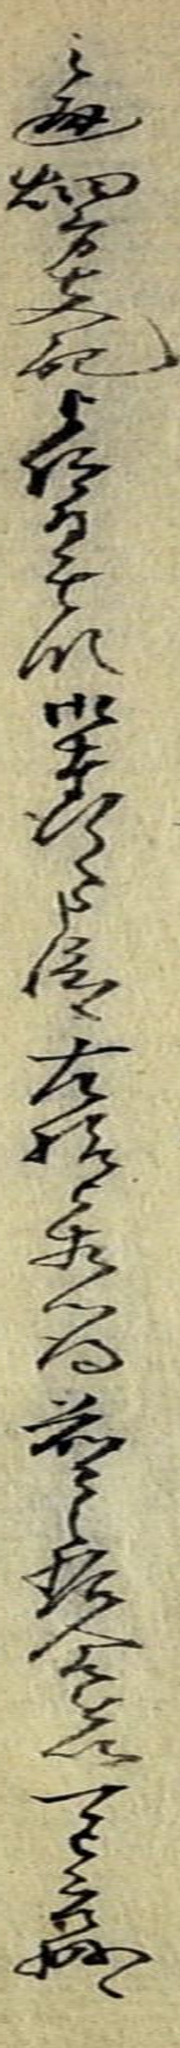之通畑方支配被仰付候段御奉行へ申渡候左様被相心得前々之振合を以可被取扱候
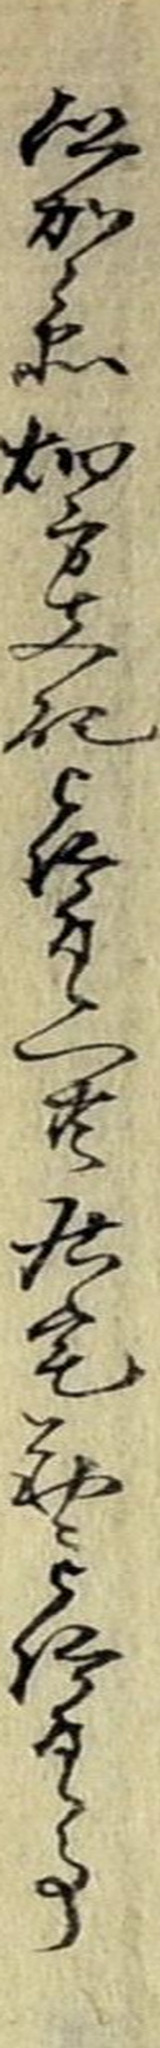但加兵衛畑方支配被仰付候へ共居宅勤被仰付候事
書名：命令之部 六
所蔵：福井県文書館 Fukui Prefectural Archives
